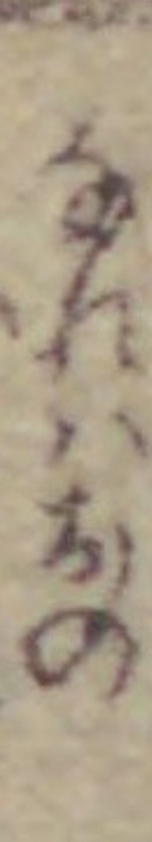なれはおの
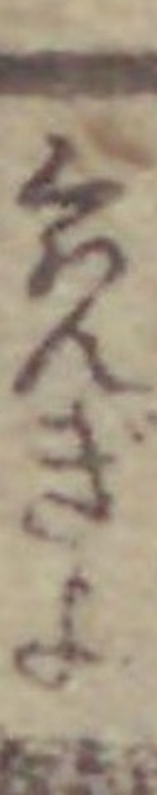くはんぎよ
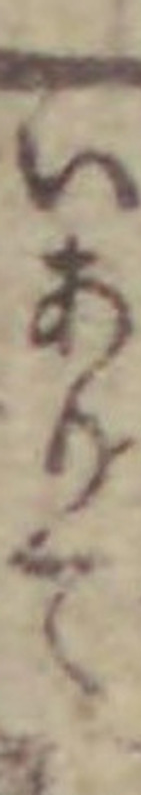いありて
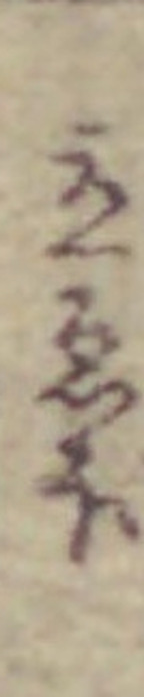立ゑぼ
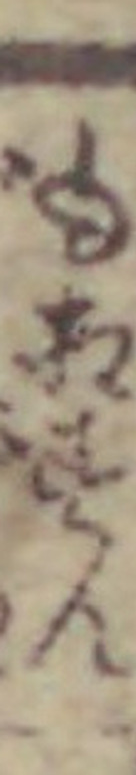も相すん
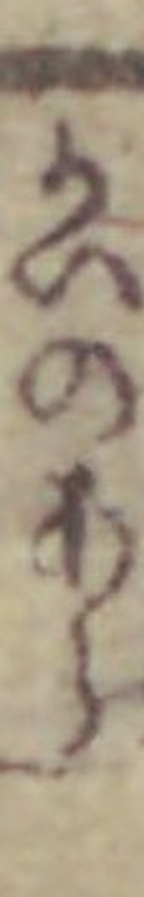かいのあら
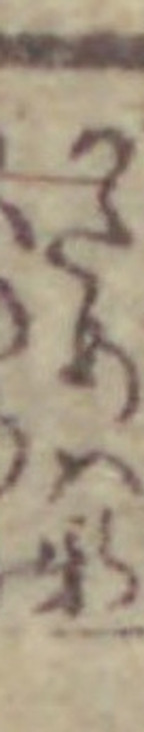がためは新
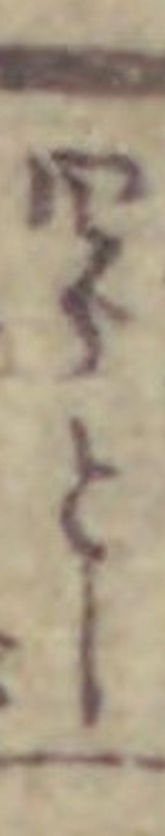四郎とし
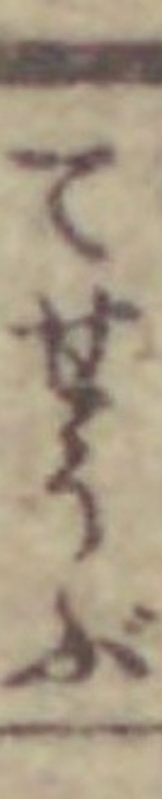てせうぶ
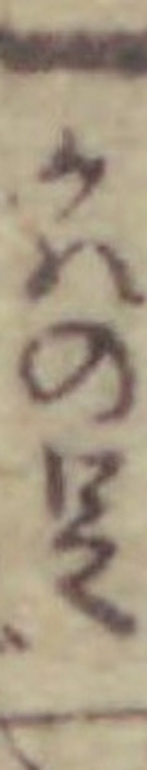かはの足
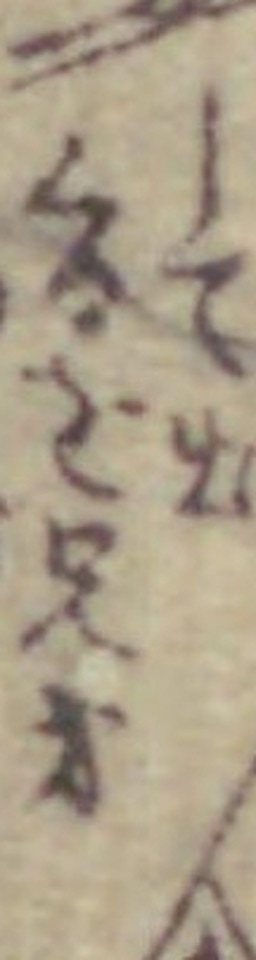くるを兄方
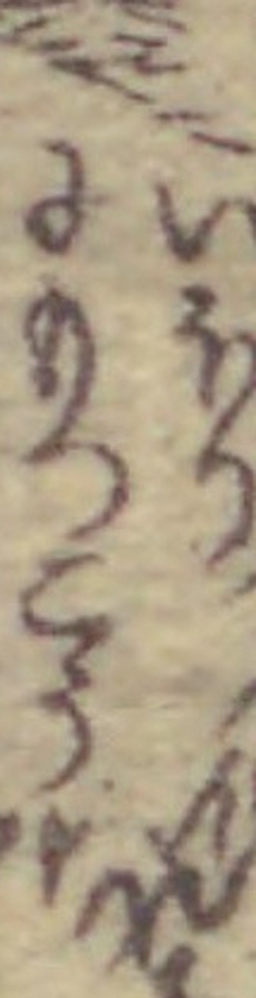にもつこう
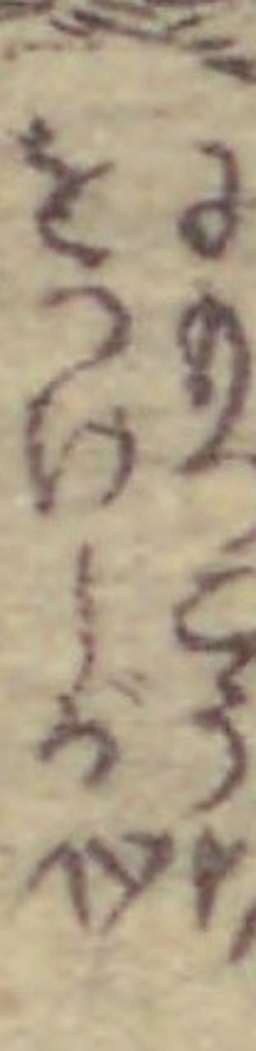をつけしが
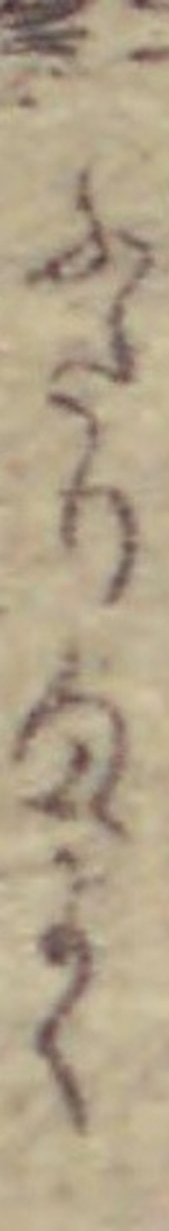ふたり様よく
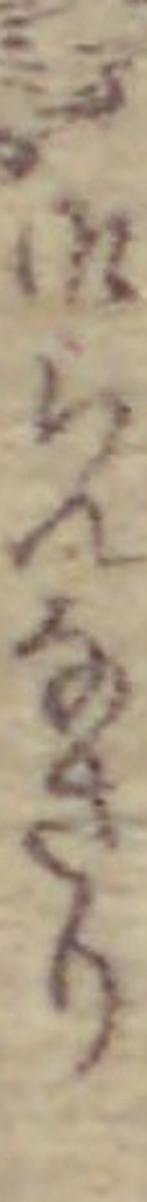御らんなさり
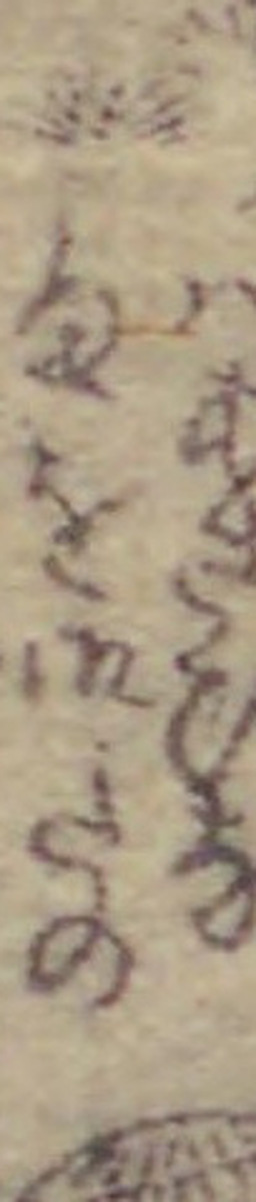様を御たの
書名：間似合嘘言曽我 3巻
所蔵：国立国会図書館 National Diet Library, JAPAN
